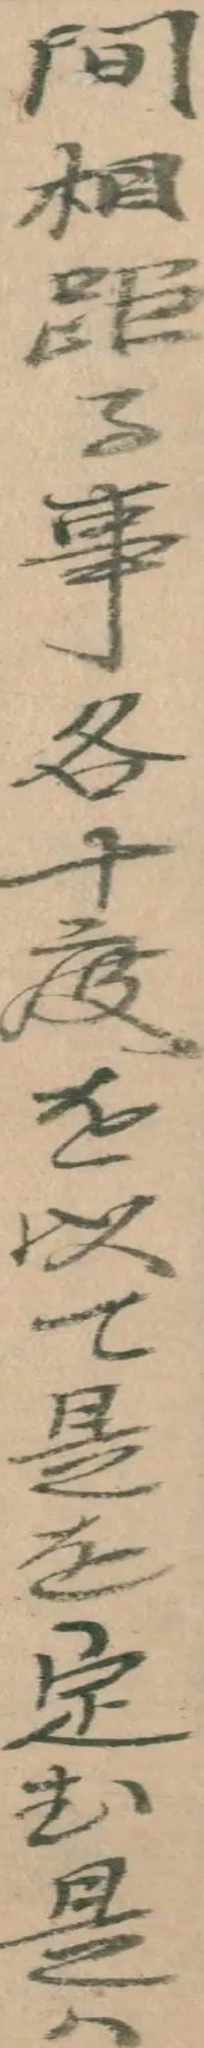間相距る事各十度を以て是を定む是は
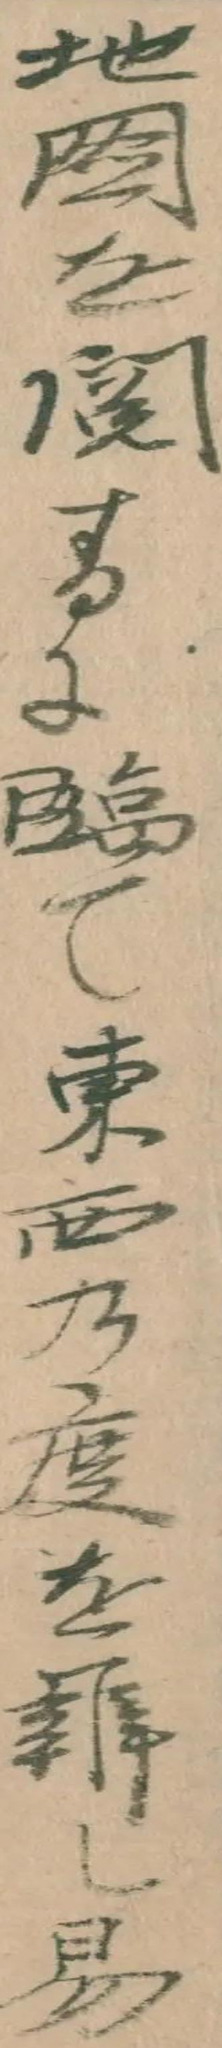地図を閲するに臨て東西の度を弁し易
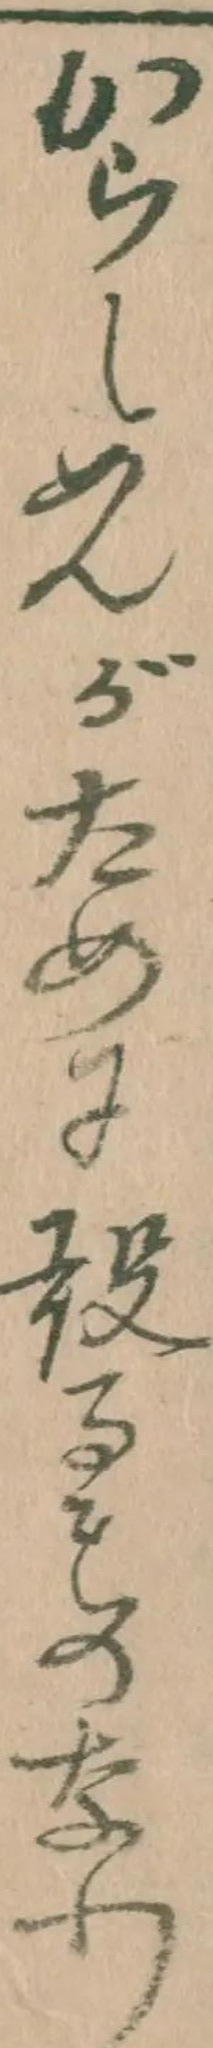からしめんがために設るものなり
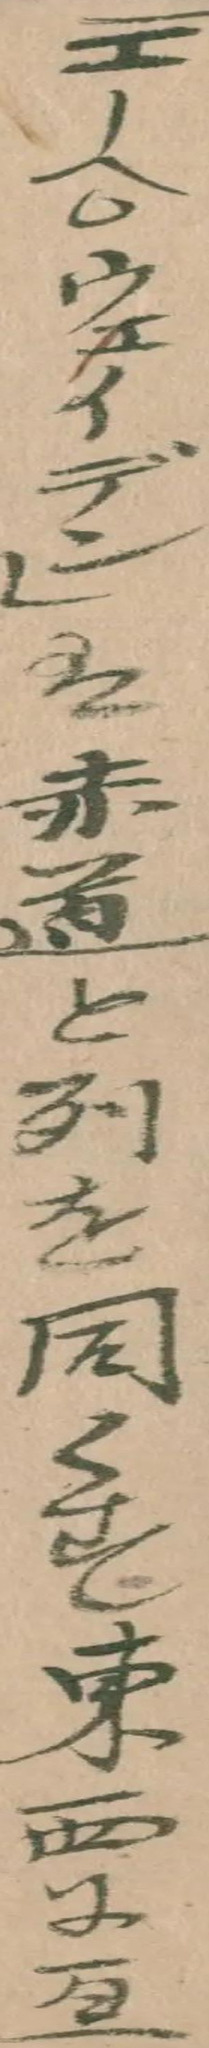「エーヘ・ウェイデン」は赤道と列を同くす東西に亘
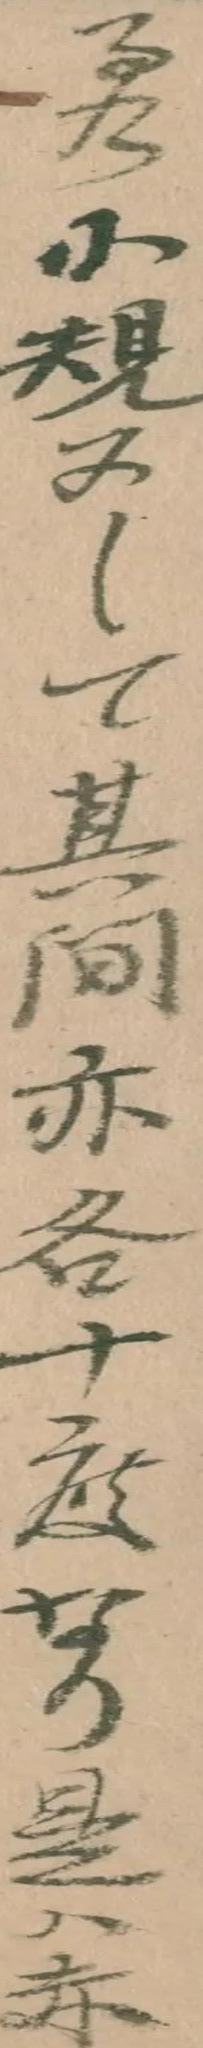るの小規にして其間亦各十度なり是は赤
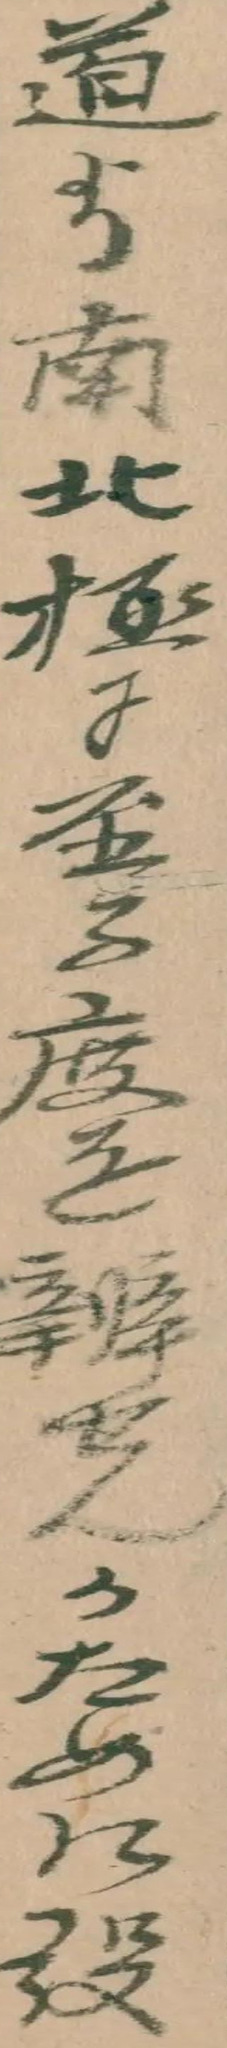道より南北極に至る度を弁せんかために設
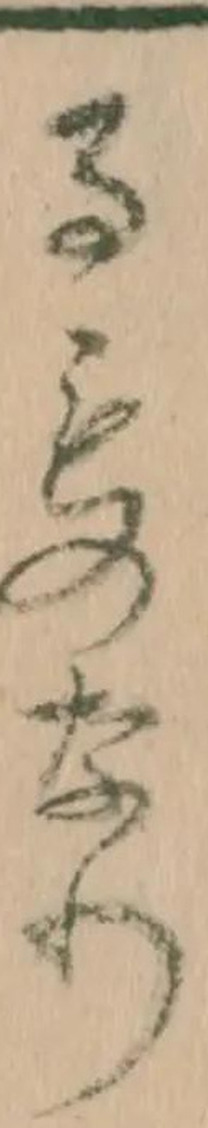るものなり
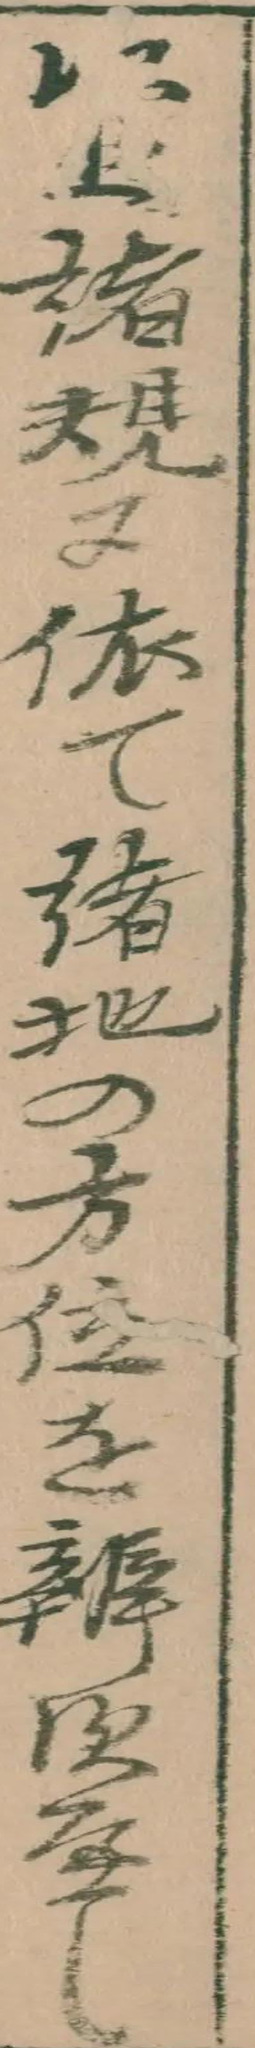以上諸規に依て諸地の方位を弁すへし
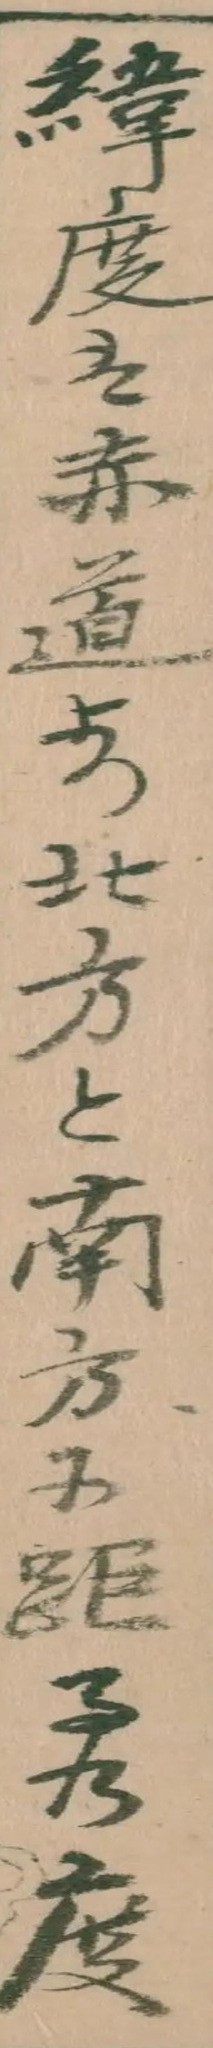緯度は赤道より北方と南方に距るの度
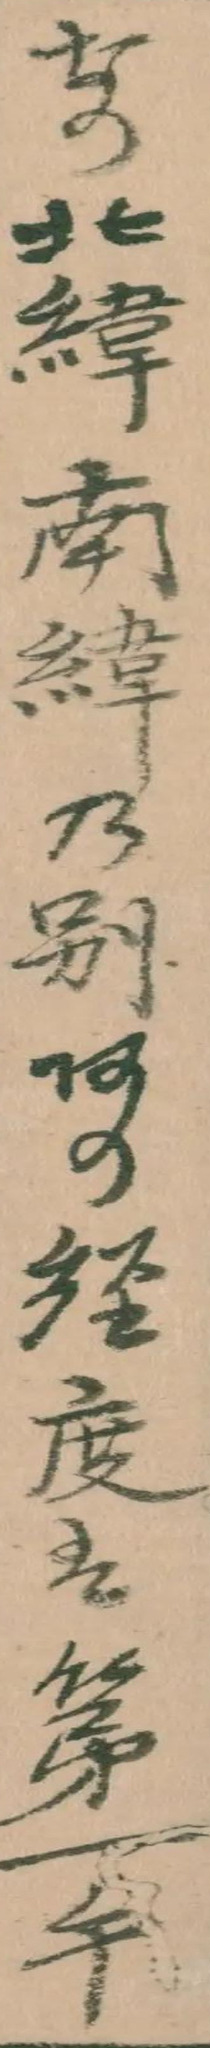なり北緯南緯の別あり経度は第一午
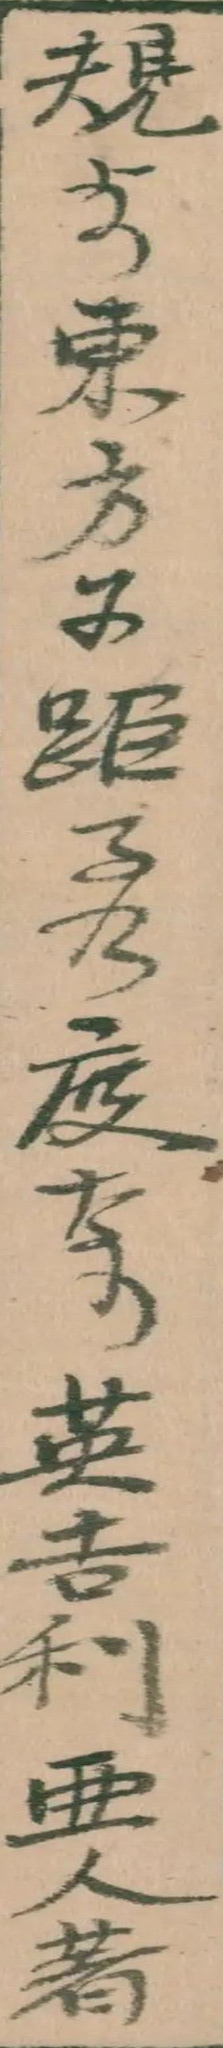規より東方に距るの度なり英吉利亜人著
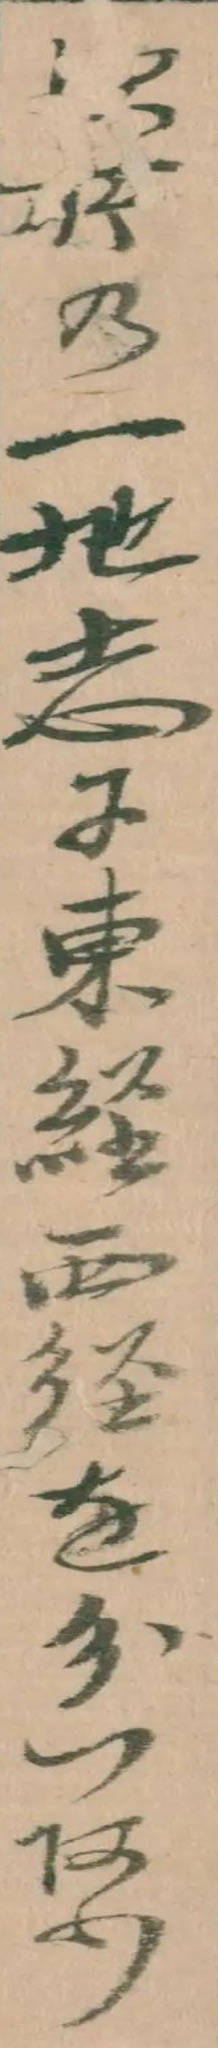す所の一地志に東経西経を分つあり
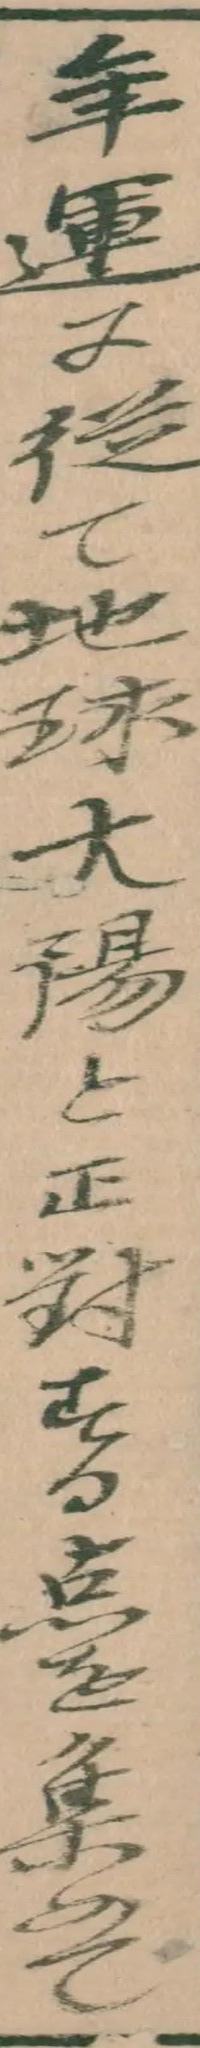年運に従て地球大陽と正対する点を集めて
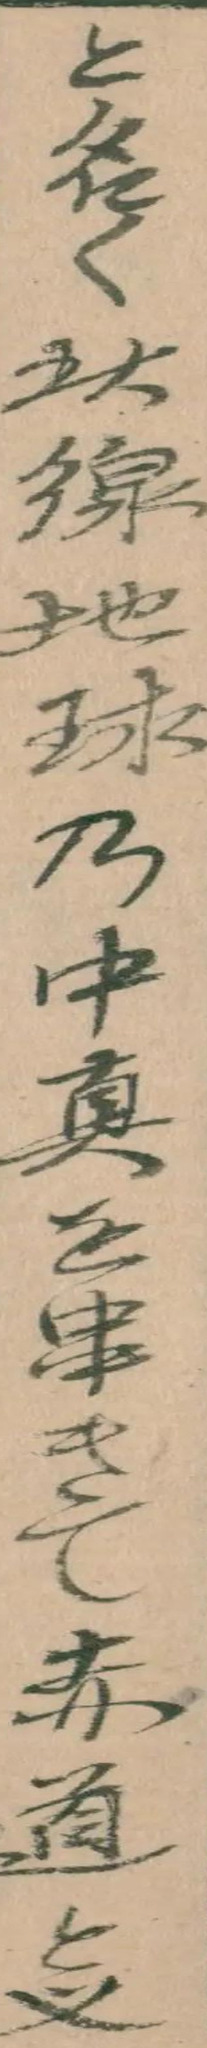と名く此線地球の中真を串きて赤道と叉
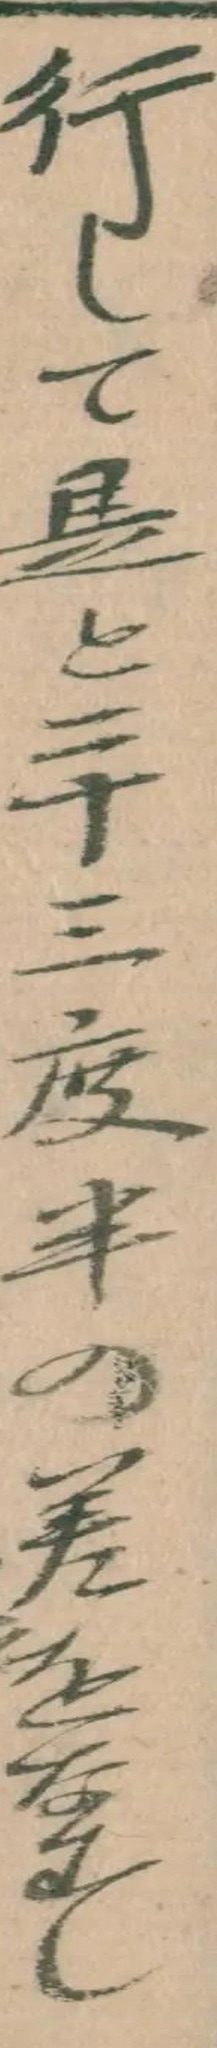行して是と二十三度半の差をなす
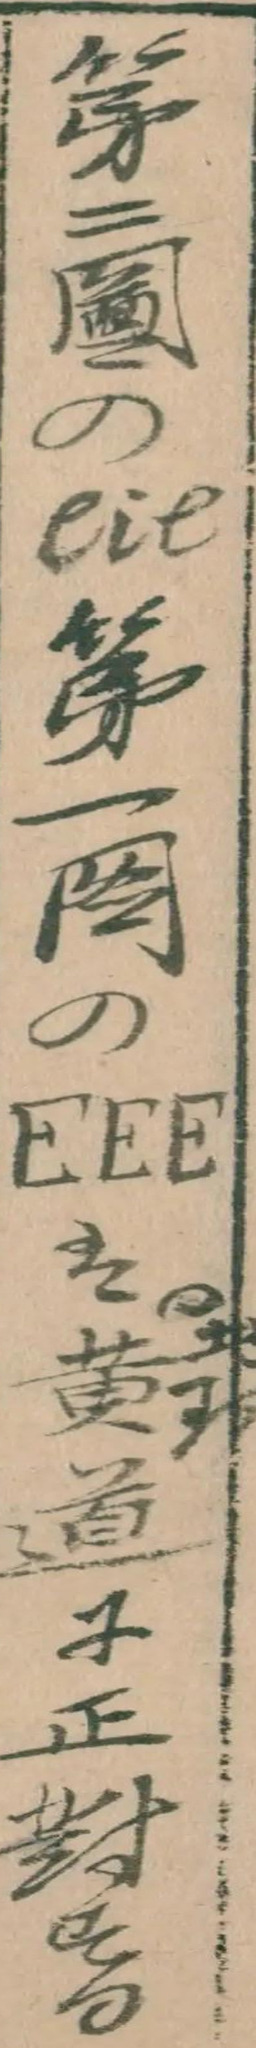第二図の第一図のは地球黄道に正対する
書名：新釈輿地図説
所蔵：国立国会図書館 National Diet Library, JAPAN
